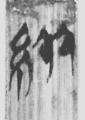{糸㼌}
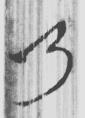乃
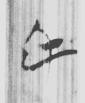身
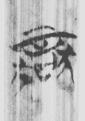獄
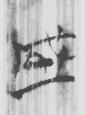城
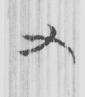又
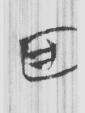耳
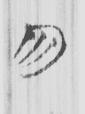勿
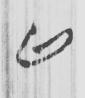㠯（以）
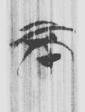不
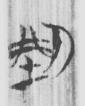型
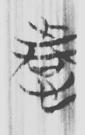𢝬
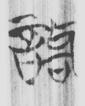詒
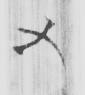又
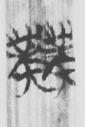{丵人丵人}
